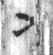又（有）
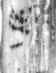○（得）
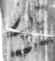生
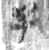子
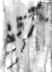男
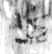必
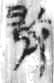{𡵂攴}（美）
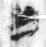於
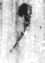人
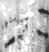內（入）
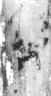貨
